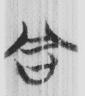同
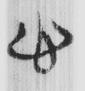心
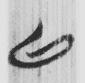㠯（以）
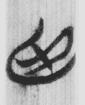臣
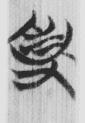事
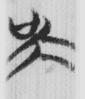吳
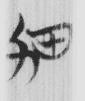男
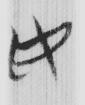女
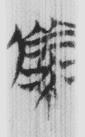備
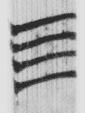亖
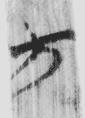方
